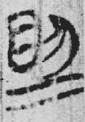則
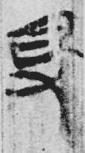○（得）
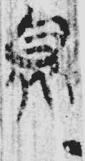衆
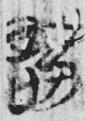誂
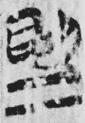則（則）
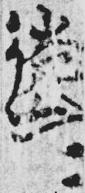遠遠
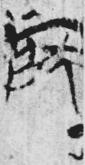戾戾
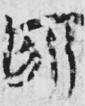所
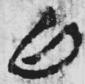㠯（以）
